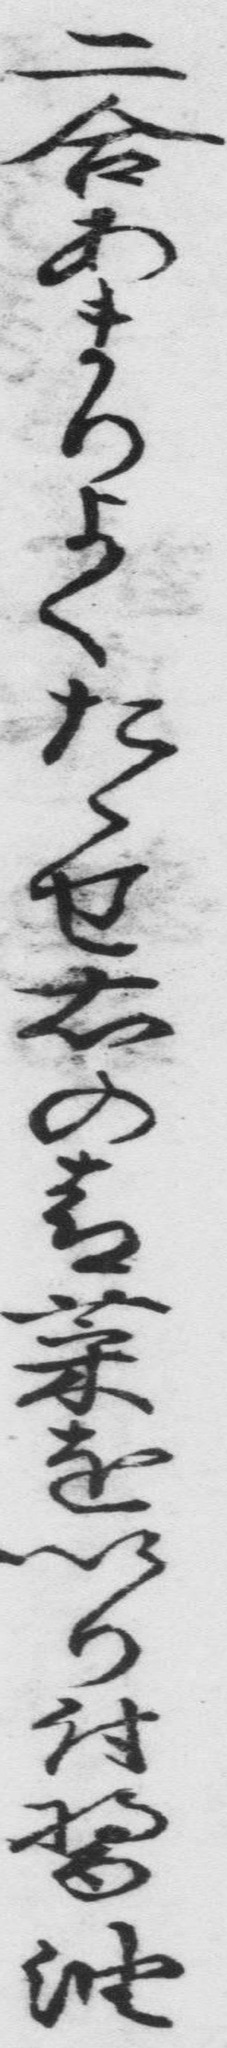二合あまりよくたゝせ右の青菜を以り付醤油
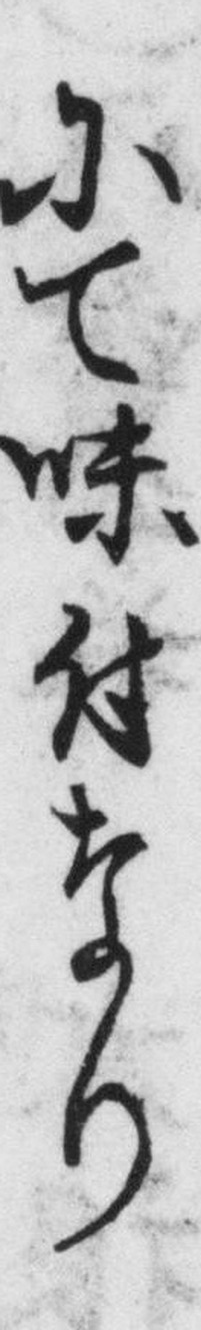尓て味付なり
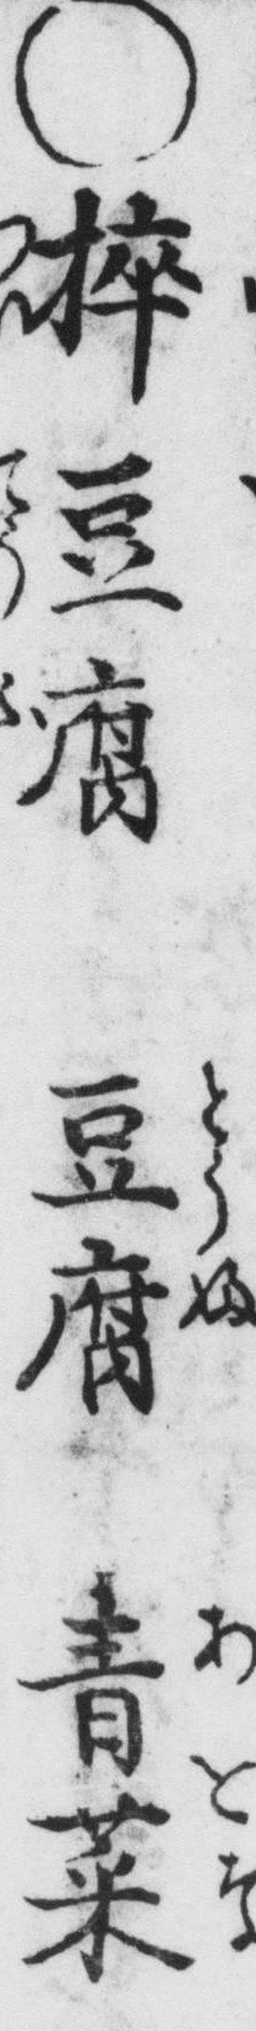◯捽豆腐豆腐青菜
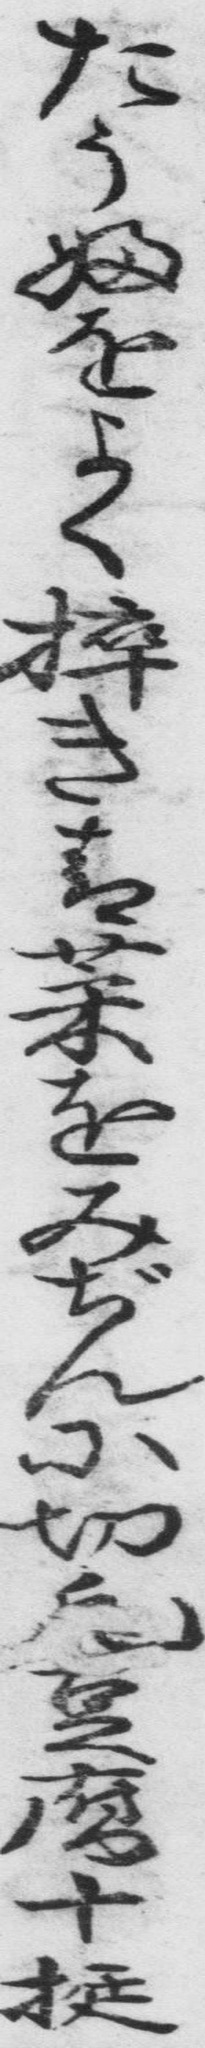たう婦をよく捽き青菜をみぢん尓切凡豆腐十挺
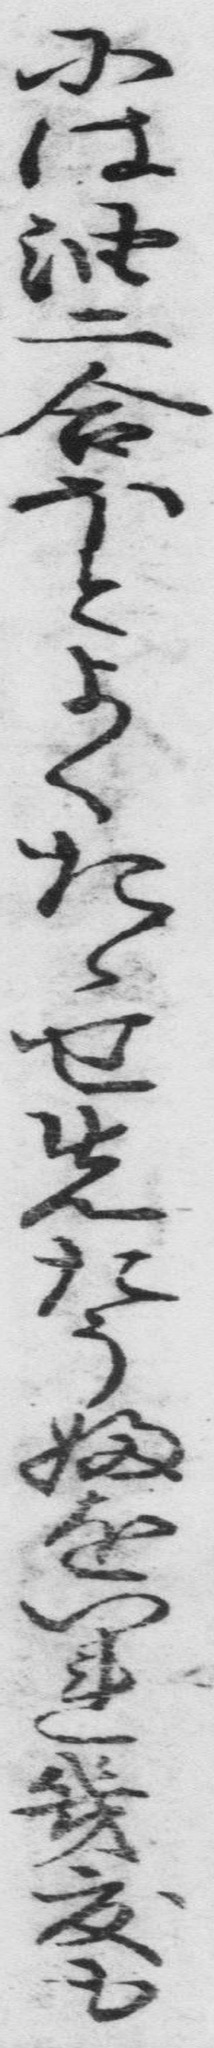尓は油二合不とよくたゝせ先たう婦をい連幾度も
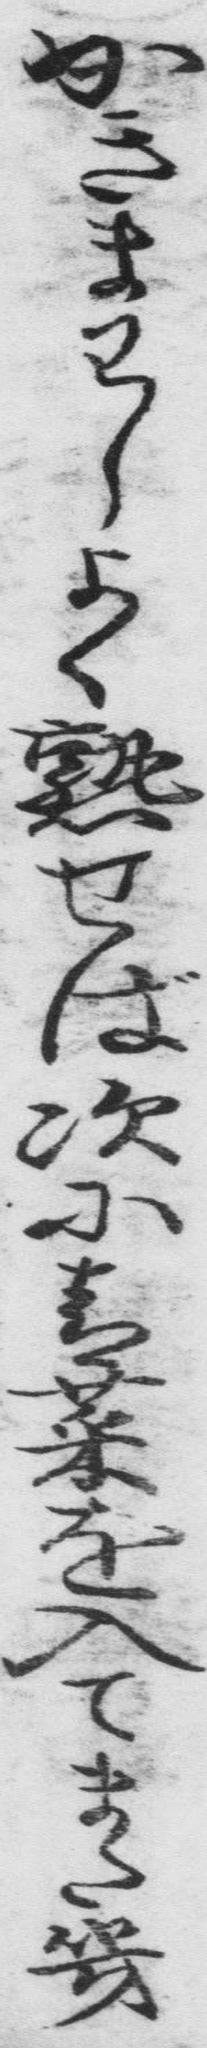かきまわしよく熟せば次尓青菜を入てまた幾
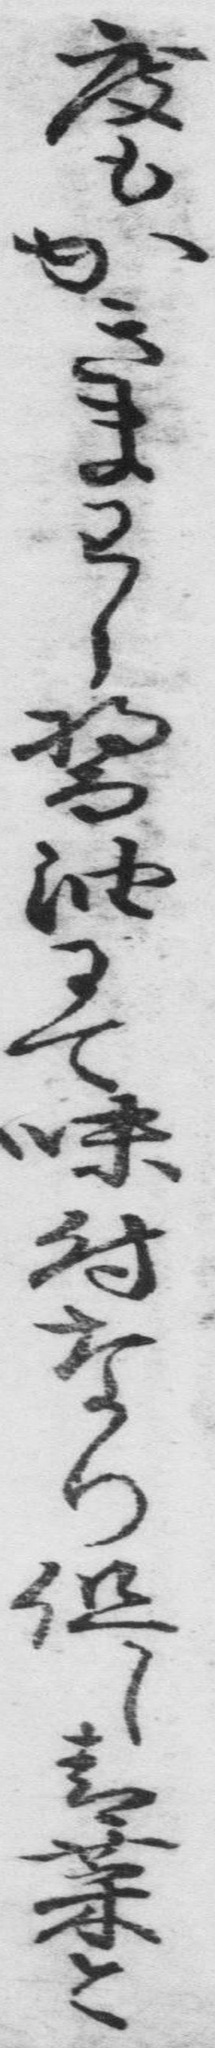度もかきまわし醤油尓て味付なり但し青菜と

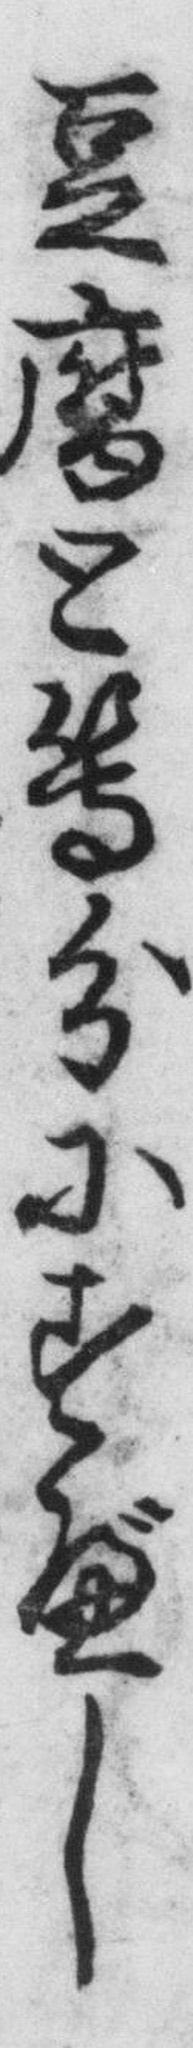豆腐と等分尓春扁し
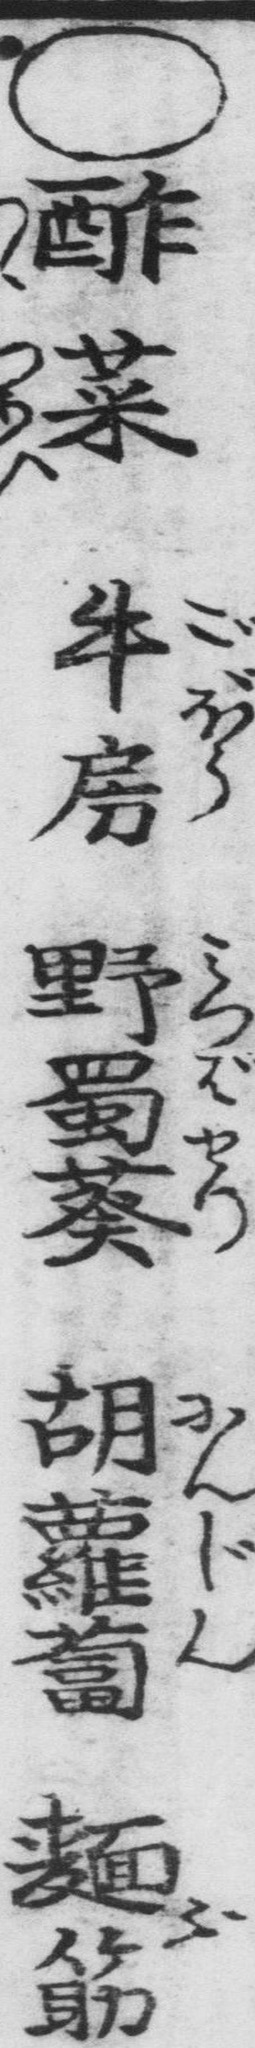◯酢菜牛房野蜀葵胡蘿蔔麺筋
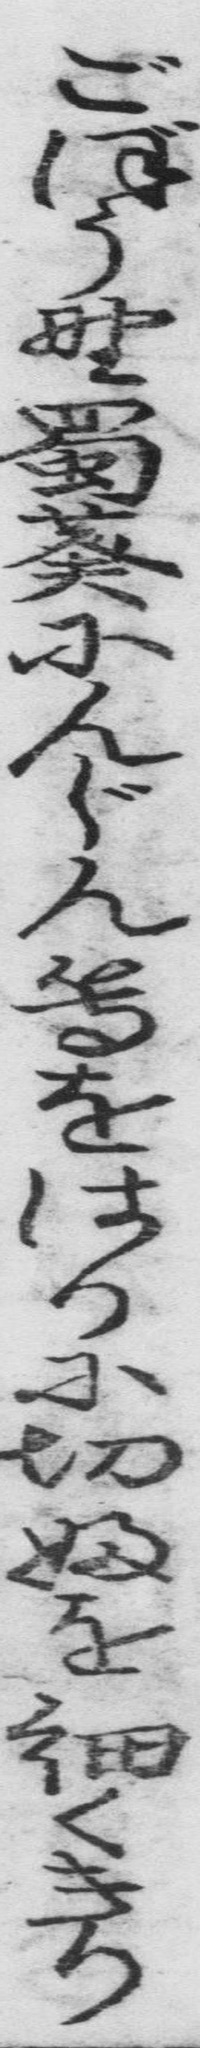ごぼう野蜀葵尓んじん等をはり尓切婦を細くきり
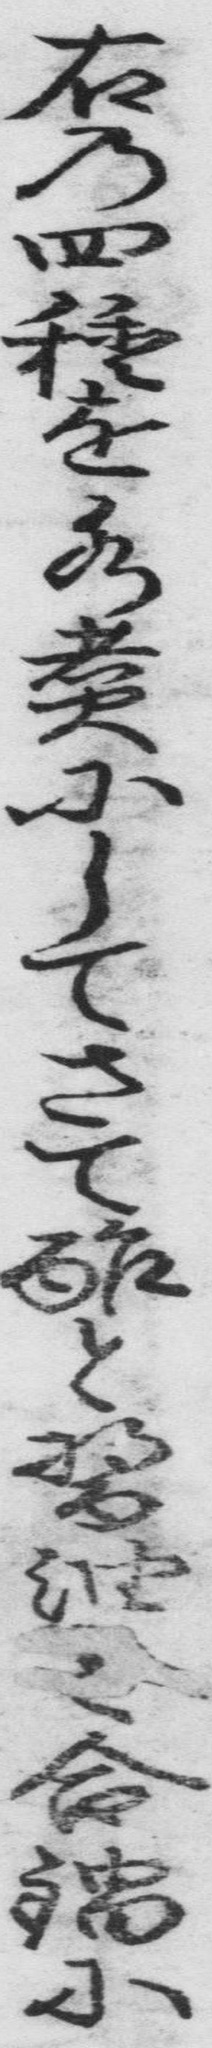右乃四種を水煮尓してさて酢と醤油と合鍋尓
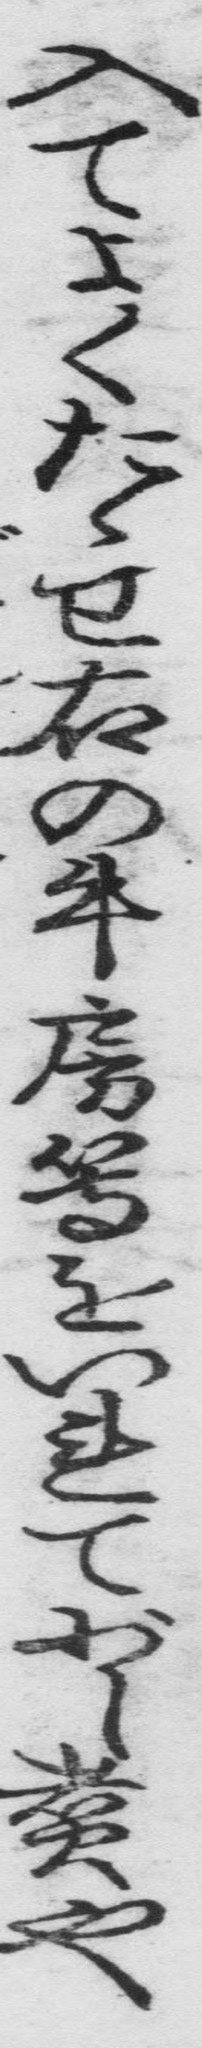入てよくたゝせ右の牛房をい連て少し煮也
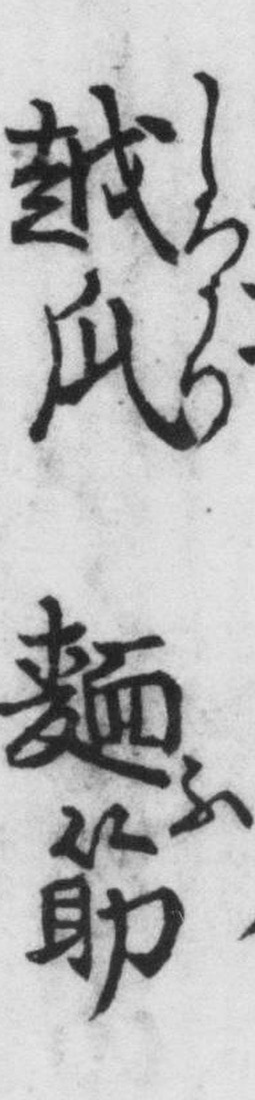越瓜麺筋
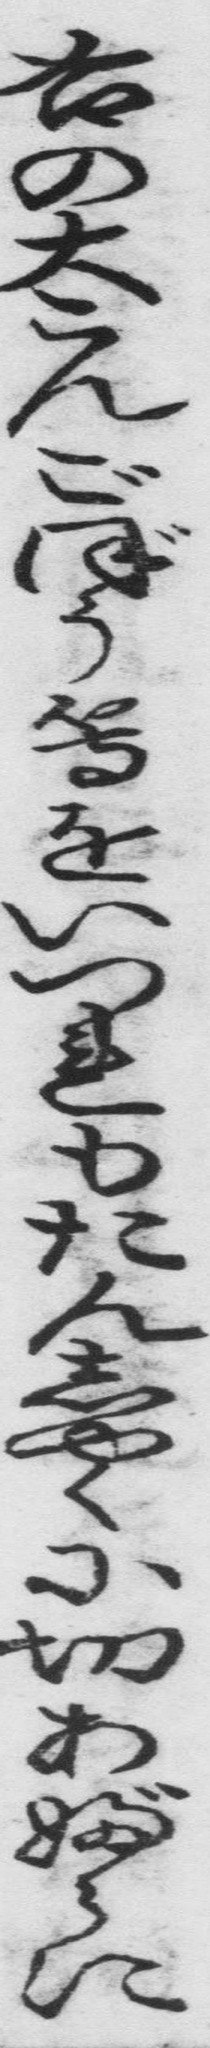右の大こんごぼう等をいつ連もたん志やく尓切あぶらに
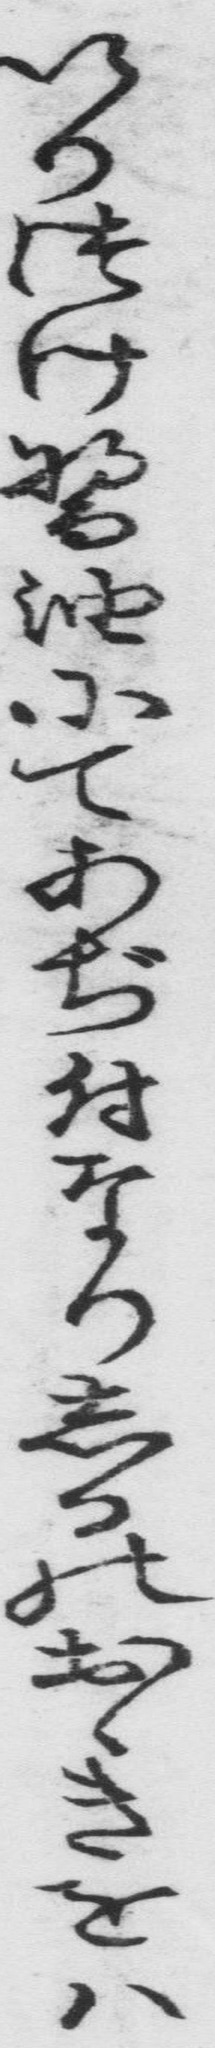以り徒け醤油尓てあぢ付なり志る能おゝきをは
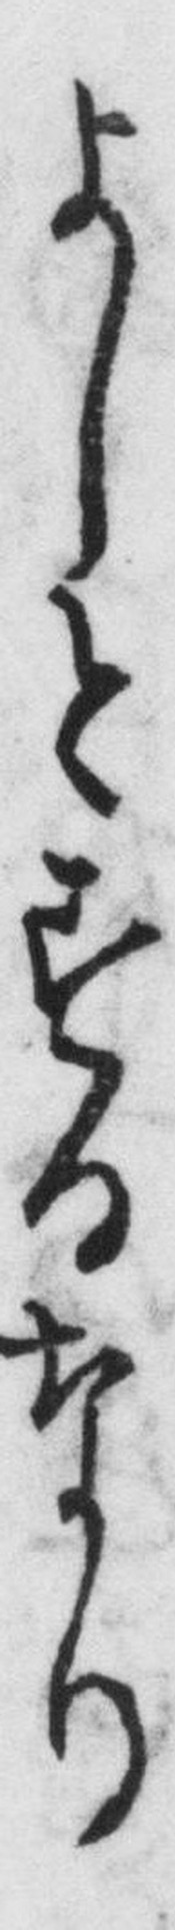よしと春るなり
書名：普茶料理抄
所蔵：大阪府立大学学術情報センター 国文学研究資料館
